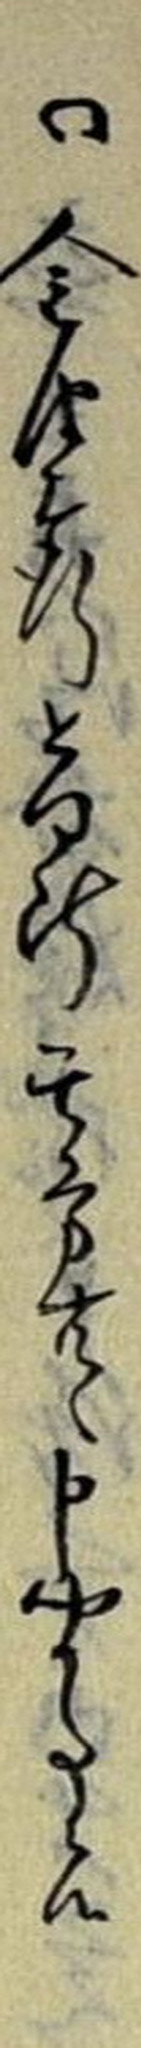〇金津奉行と同断其方共へ申聞事に候
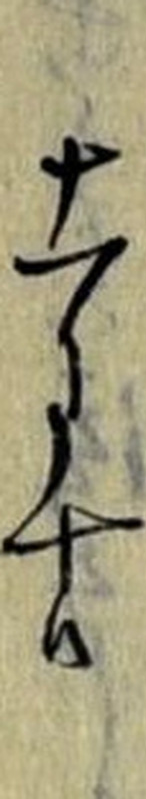十一月十日
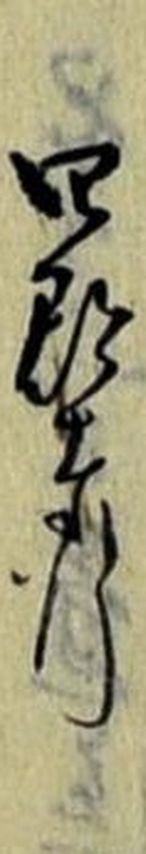四郡奉行
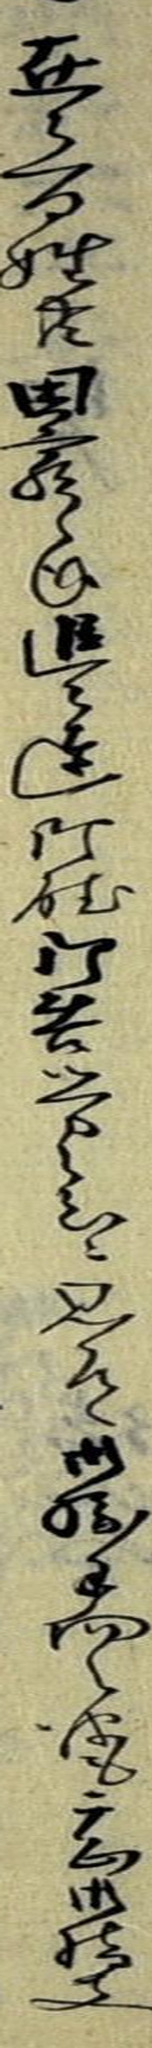〇在々百姓共困窮之趣追々達御聴御苦労之至に思召候御勝手向之儀も甚御指支
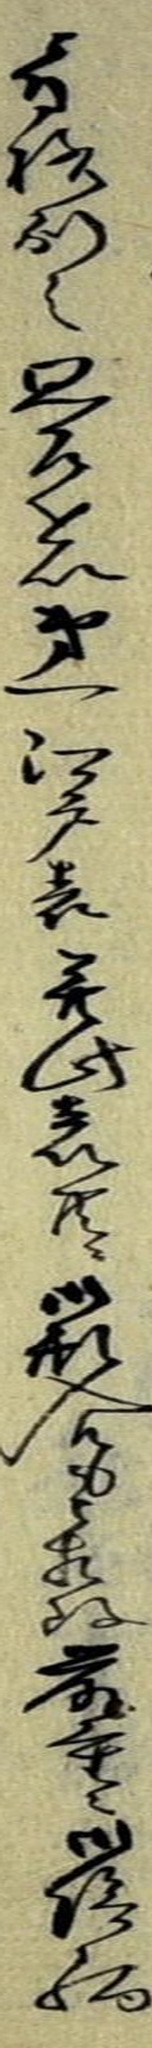に付格別之思召を以第一江戸表并此表共に御形合も被相改厳重に御倹約
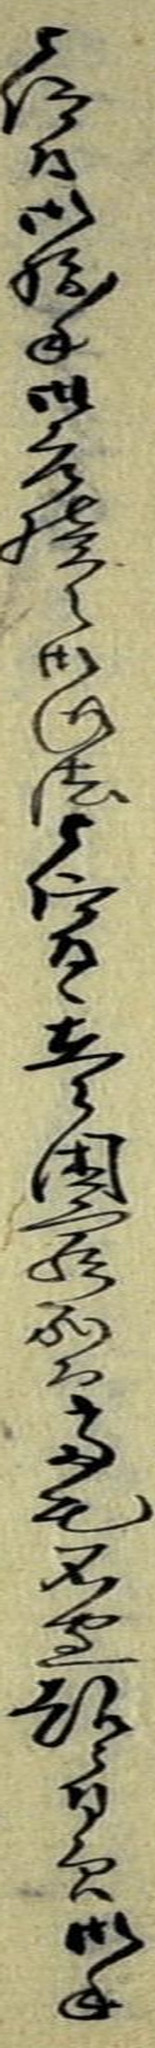被仰付御勝手御取続之御趣法被仰付候在々困窮別而当毛不宜趣に付而は御手
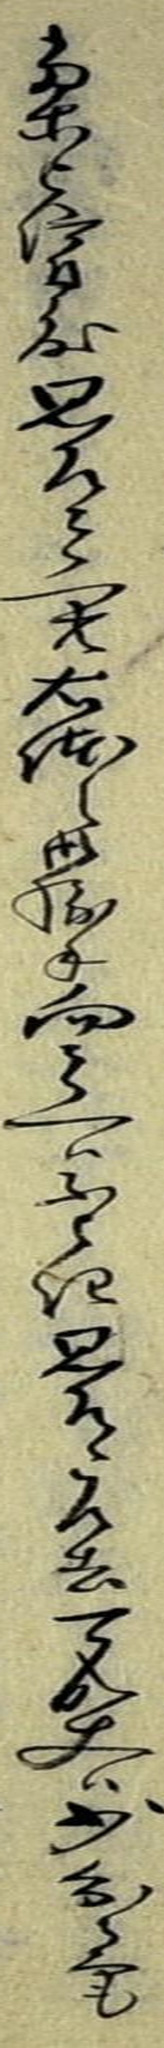当等被仰付度思召に候へ共右体之御勝手向に候へは不被任思召候乍去可成丈は少分に而も
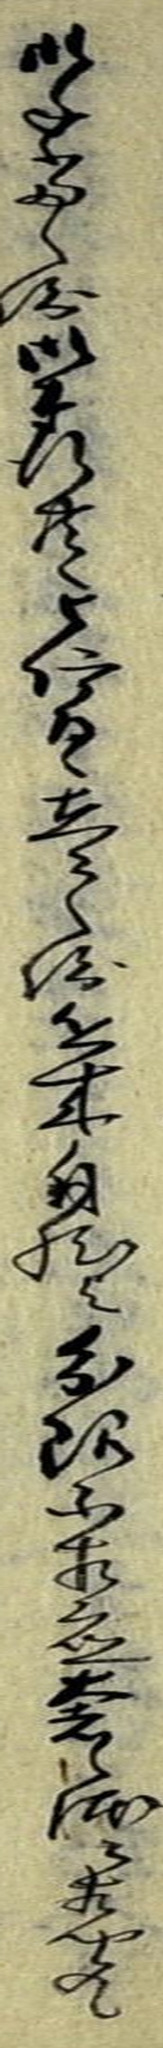御手当之儀御奉行共へ被仰付候在々之儀近来自然与分限不相応奢之儀に相聞候
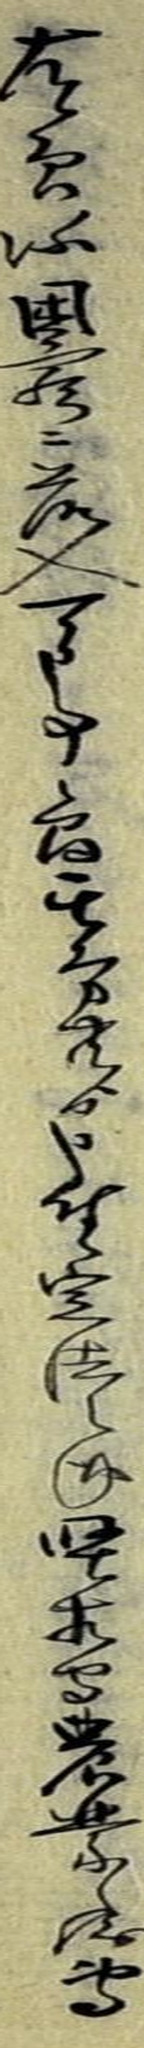左候而は弥困窮に落入可申事候間其方共ゟ申付候定法之趣堅相守農業之儀専
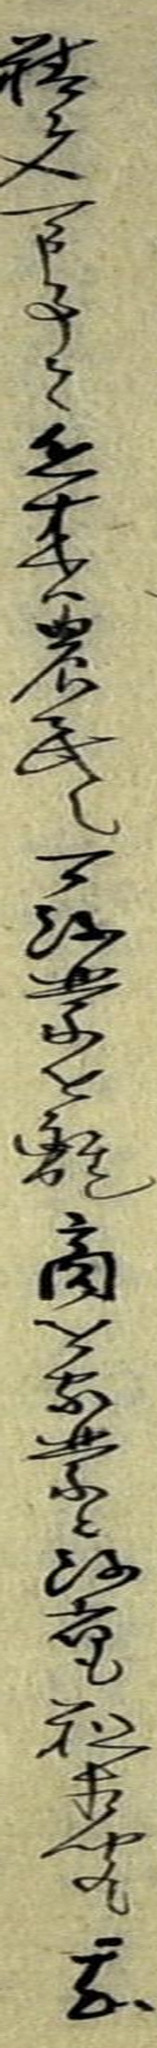精に入可申事に候近来は農民之可致業を離れ商を家業と致者も粗相聞候甚
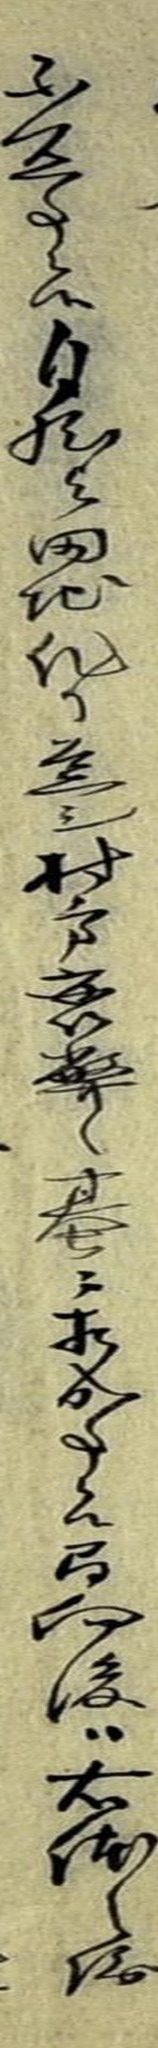不宜事に候自然与田地作り荒し村方衰弊之基に相成事に候間向後は右体之儀
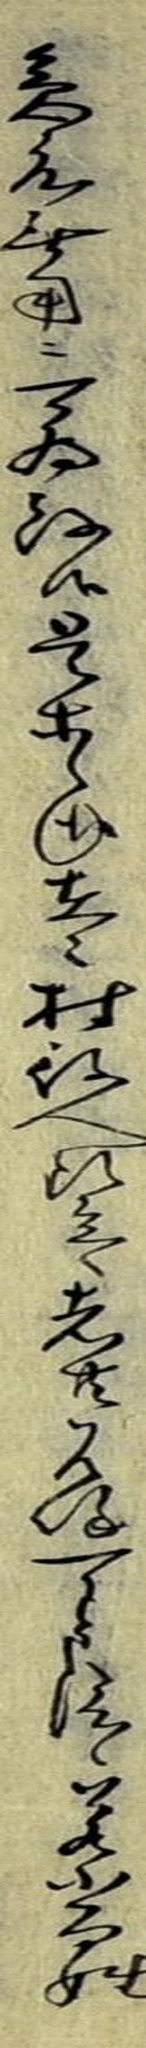急度無用に可為致候是等之趣在々村役人頭立之者共召呼可被申渡候若小百姓
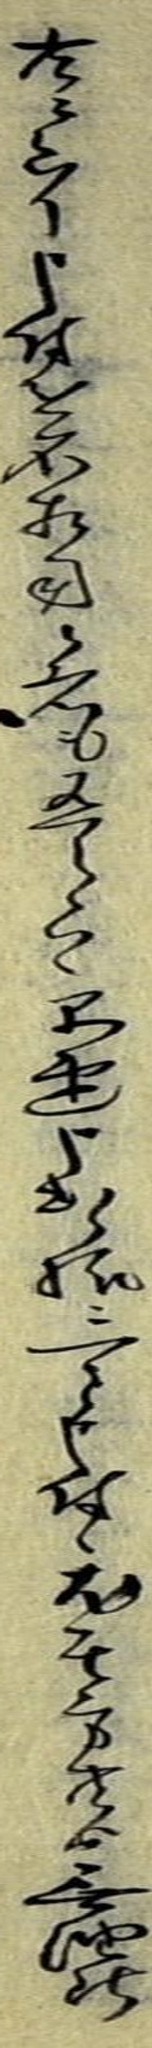共に至り申付を不相用候者も有之候はゝ早速申出候様に可被申付候尤其方共ゟ無油断
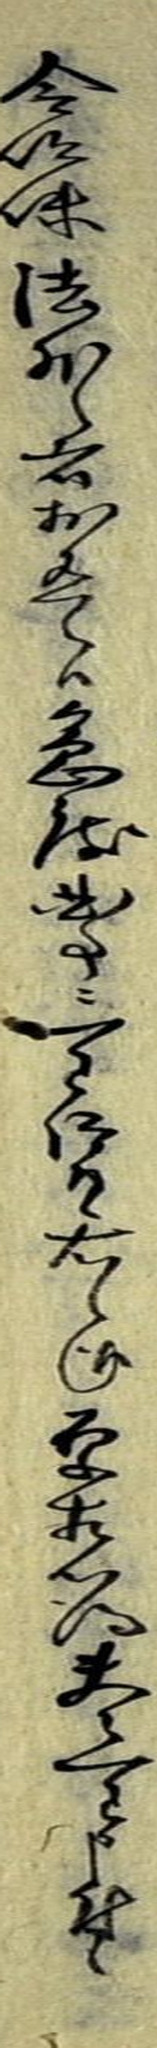令吟味法外之者於有之は急度曲事に可被仰付候右之趣厚相心得夫々可被申付候

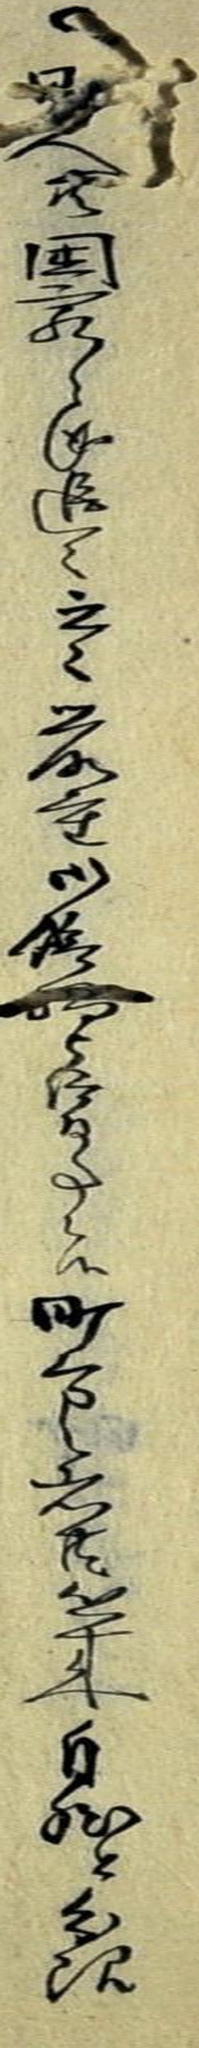町人共困窮之趣追々云々厳重御倹約被仰付事に候町方之者共近来自然と分限
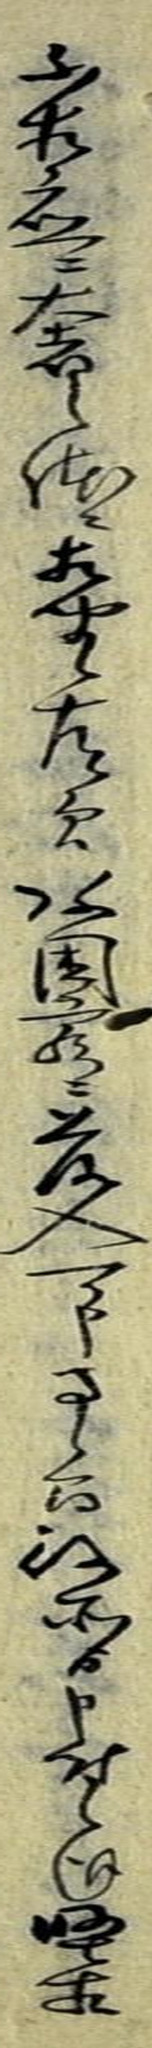不相応に奢之体に相聞候左候而は弥困窮に落入可申事候間役所ゟ申付候趣堅相
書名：命令之部 二
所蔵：福井県文書館 Fukui Prefectural Archives
